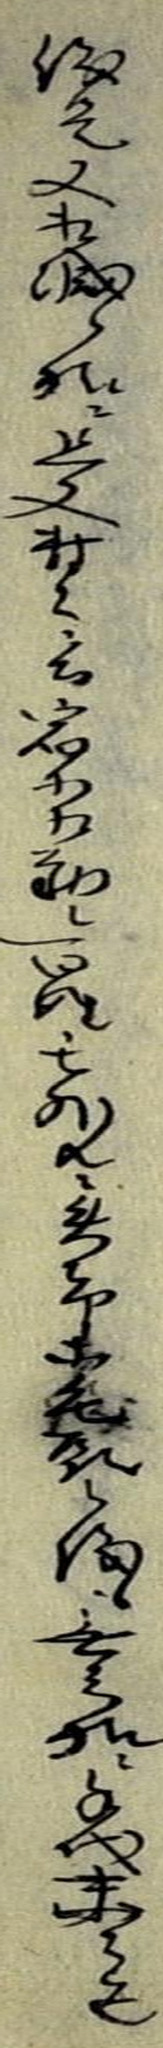儀是又相減候様ニ且又村々ニ而宿不相勤候百姓其外共ニ失却等毛頭之儀も無之様ニ手代末々迄
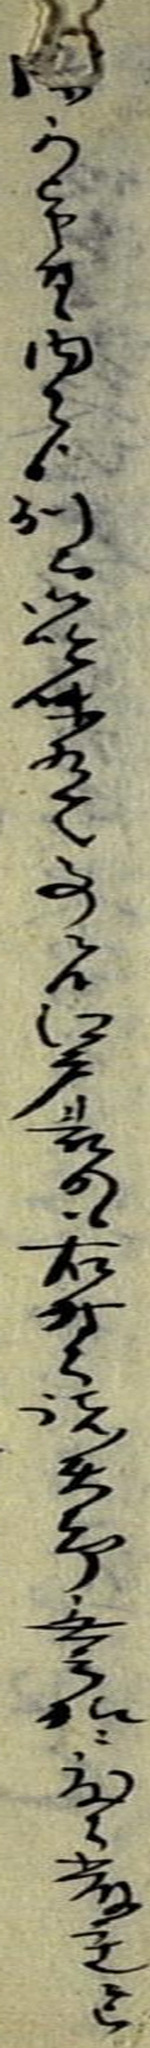可被申付候内々ゟ別而御吟味有之事ニ候江戸表ゟも右村々へ諸失却無之様ニ度々厳重ニ被
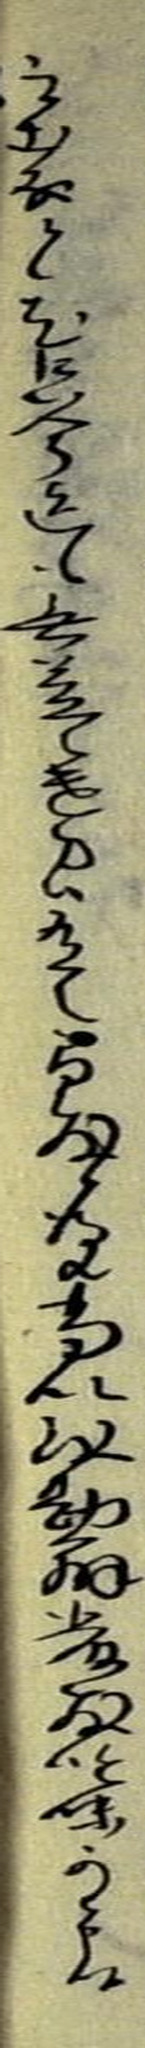仰出義ニ候尤只今迄も無益之遣方ハ有之間敷候得共尚以致勘弁厳敷吟味可被申候
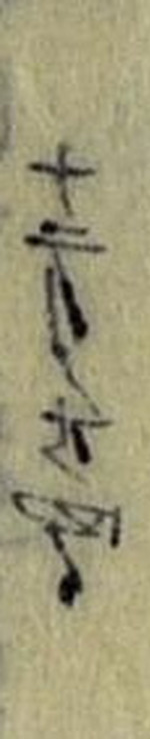十二月二日

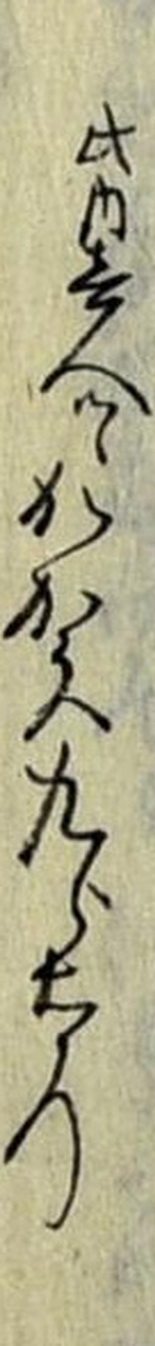此内壱人ツヽ加賀九郎右衛門
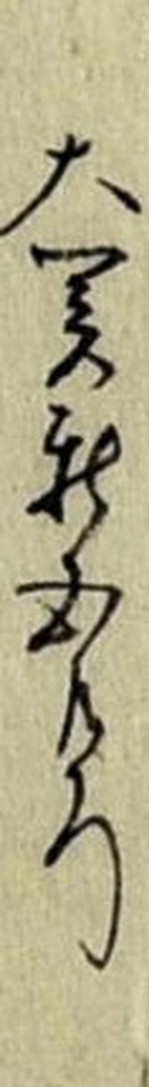大関新五左衛門
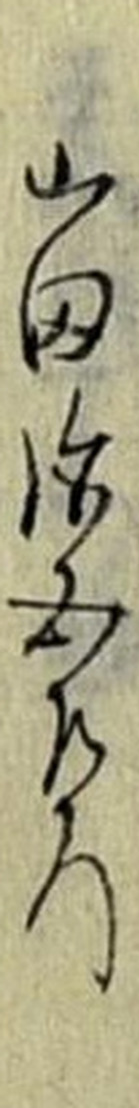山田弥五左衛門
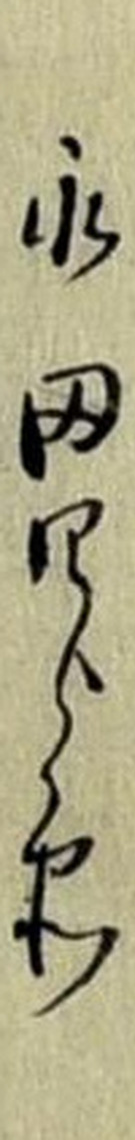永田四郎兵衛
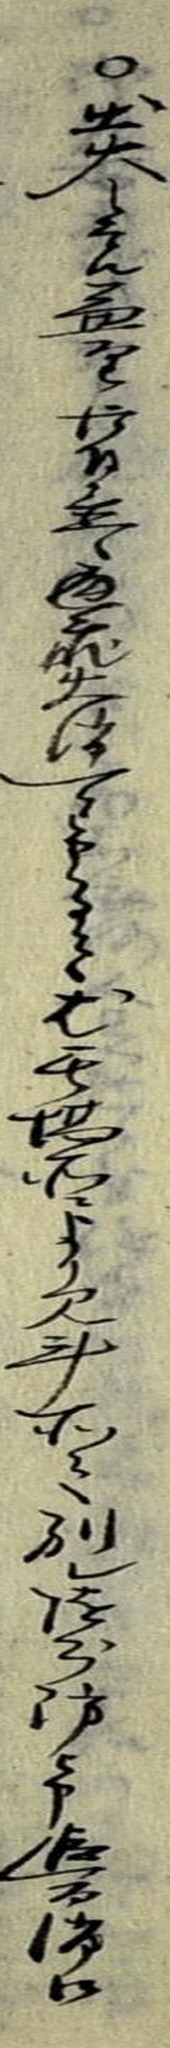〇出火之節兼而被仰付置候通火消可被申事ニ候尤其場所ニより見計所々へ別レ随分防被申追而消口
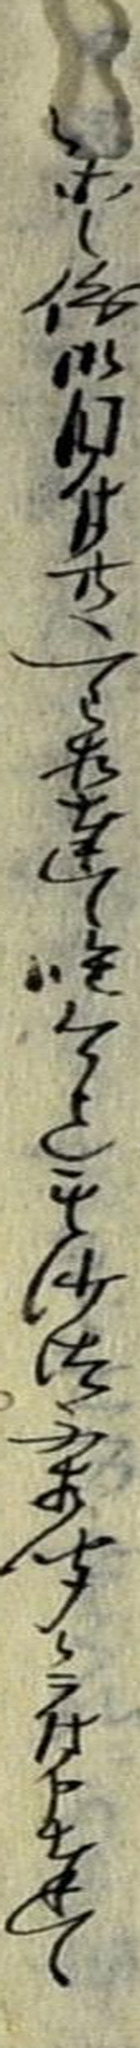等之儀御目付共へ可被相達候唯今迄其沙汰不相聞候ニ付申達候
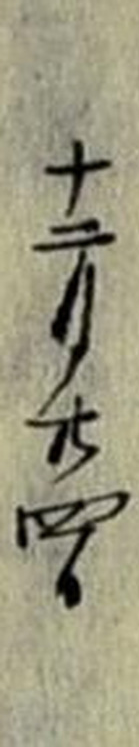十二月廿四日
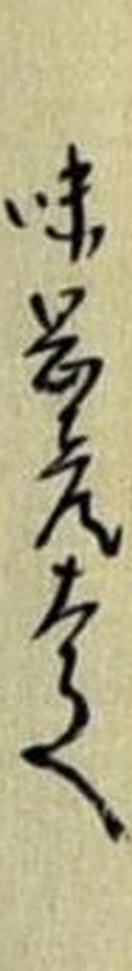味岡彦大夫
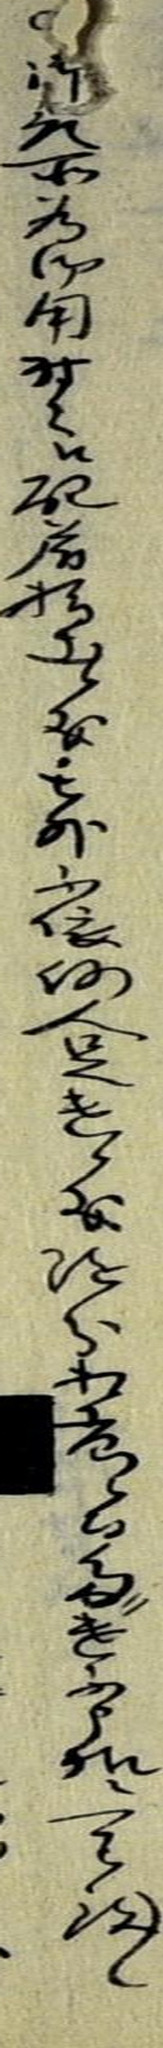〇御預所為御用村々江配府指出候義其外不依何人足遣候義随分相考候而多ク遣不申様ニ可被致候
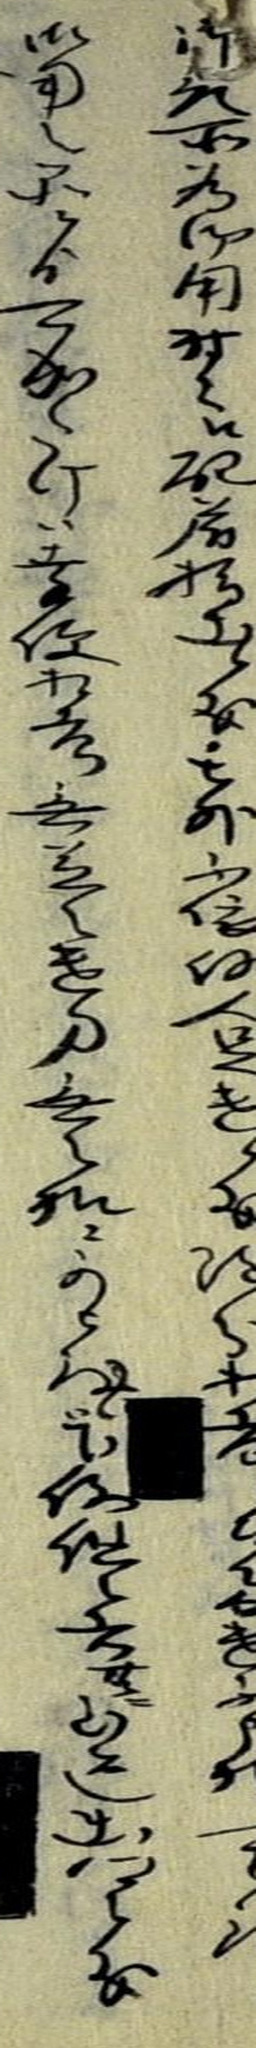御用之品ニゟ可成たけハ幸便相考無益之遣方無之様ニ可被致候下役組之者共ニ山廻出郷之義
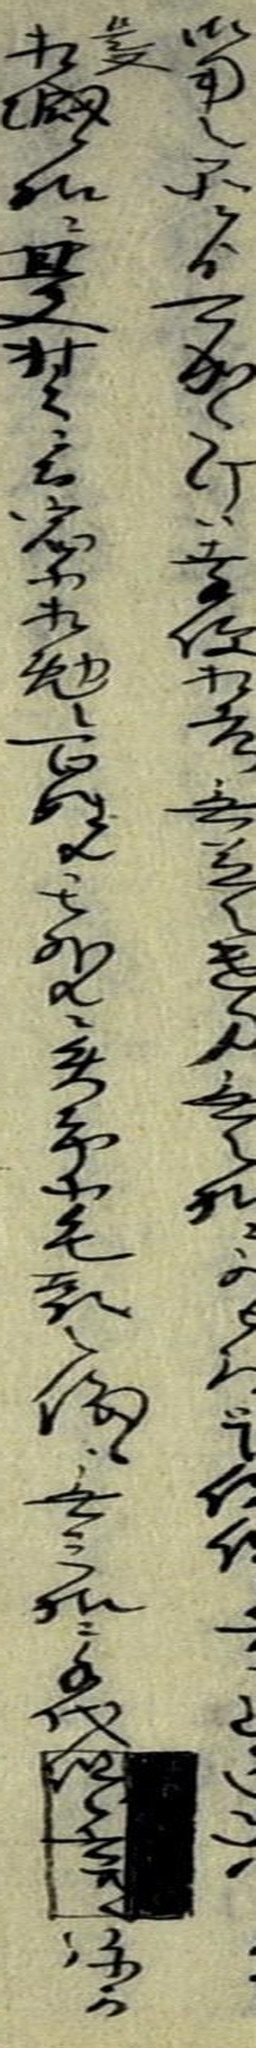是又相減候様ニ且又村々ニ而宿不相勤候百姓共其外共ニ失却等毛頭之儀も無之様ニ手代組之者共へ弥可
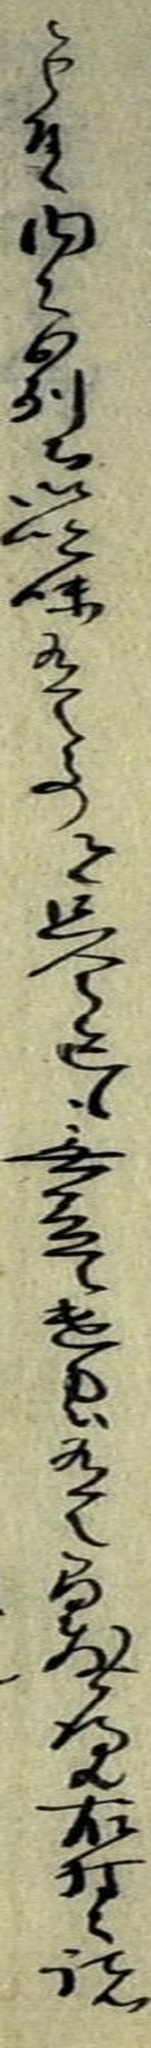被申付候内々ゟ別而御吟味有之事ニ候只今迄も無益之遣方ハ有之間敷候得共右村々諸
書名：命令之部 一
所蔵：福井県文書館 Fukui Prefectural Archives
